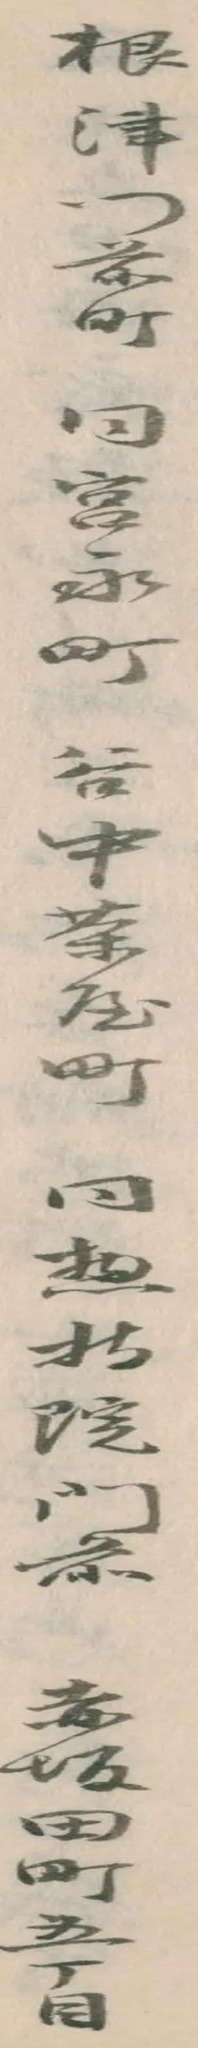根津門前町同宮永町谷中茶屋町同惣持院門前赤坂田町五丁目
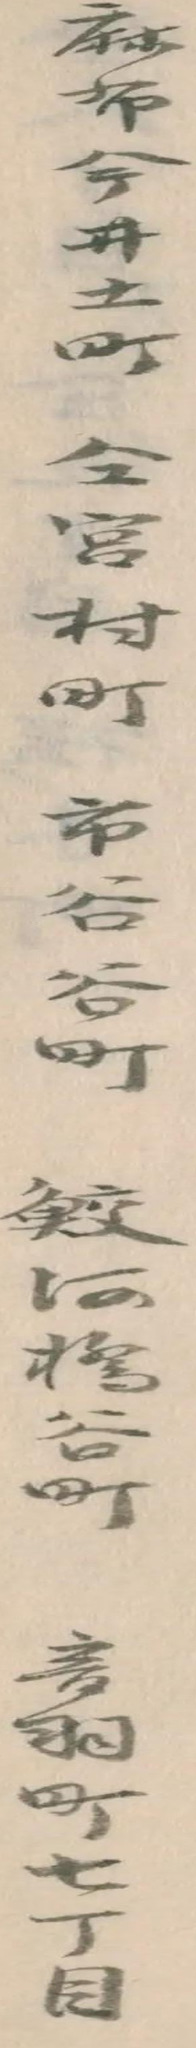麻布今井土町仝宮村町市谷谷町鮫河橋谷町音羽町七丁目

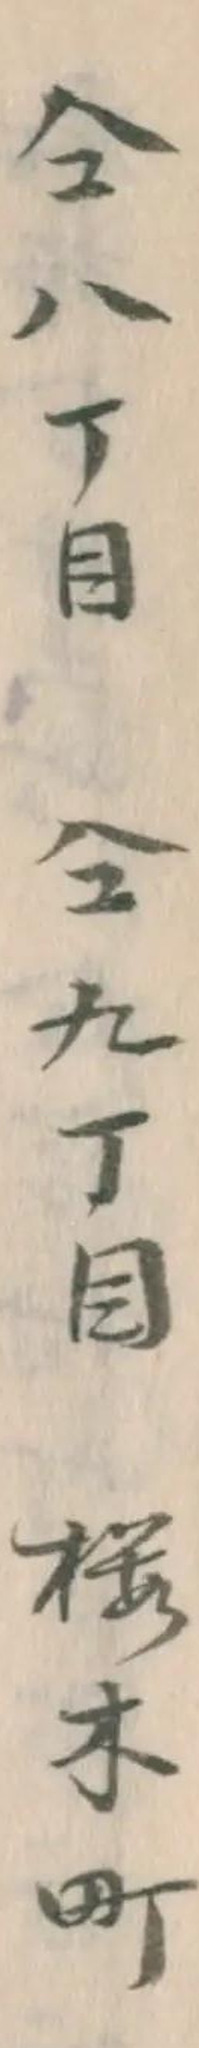仝八丁目仝九丁目桜木町
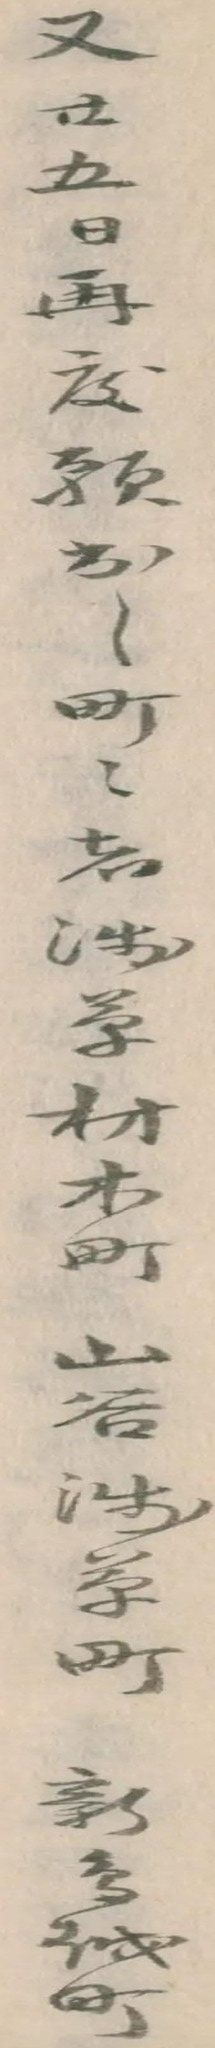又廿五日再度願出し町々は浅草材木町山谷浅草町新鳥越町
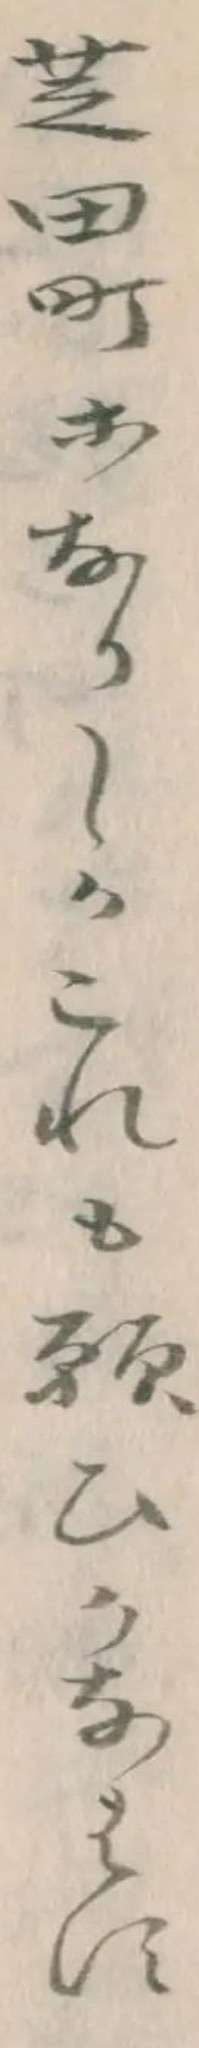芝田町等なりしかこれも願ひかなはす
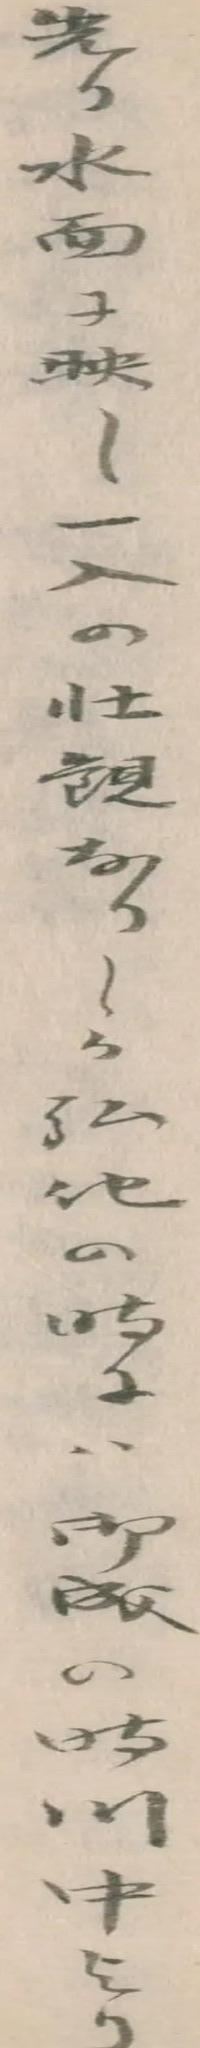光り水面に映し一入の壮観なりしか弘化の時には御成の時川中より
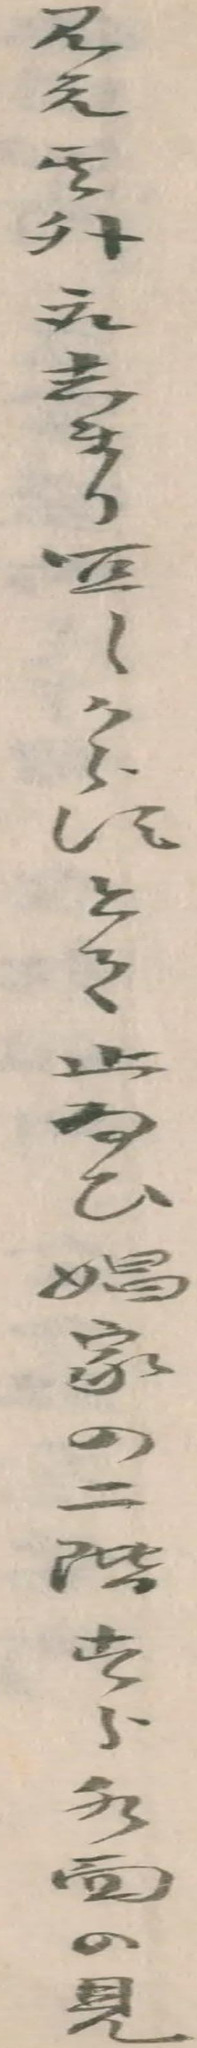見え其外取しまり宜しからすとて止給ひ娼家の二階すら水面の見
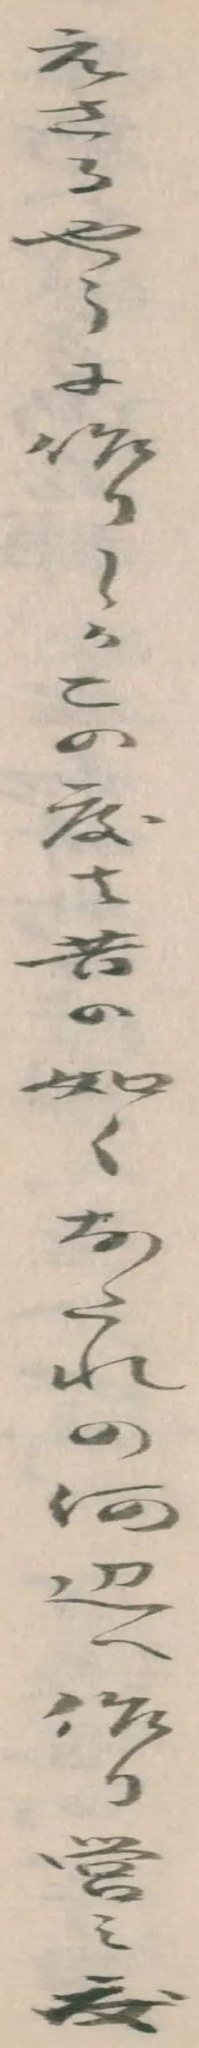えさるやうに作りしかこの度は昔の如くなたれの河辺へ作り営み度
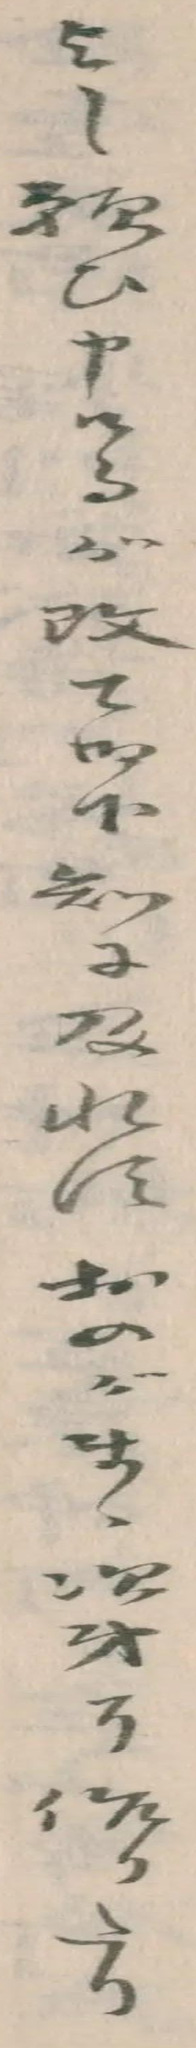よし願ひ申けるが改て御下知に及れすおのがまゝ次第に作りたり
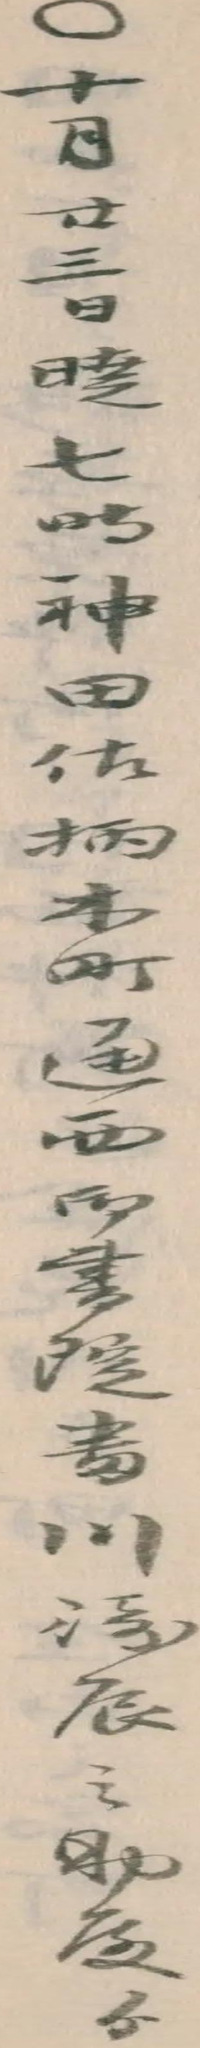〇十月廿三日暁七時神田佐柄木町通西御書院番川崎辰之助殿ゟ
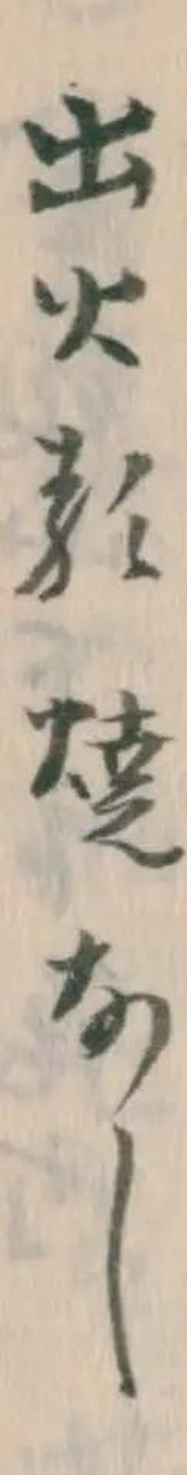出火類焼なし
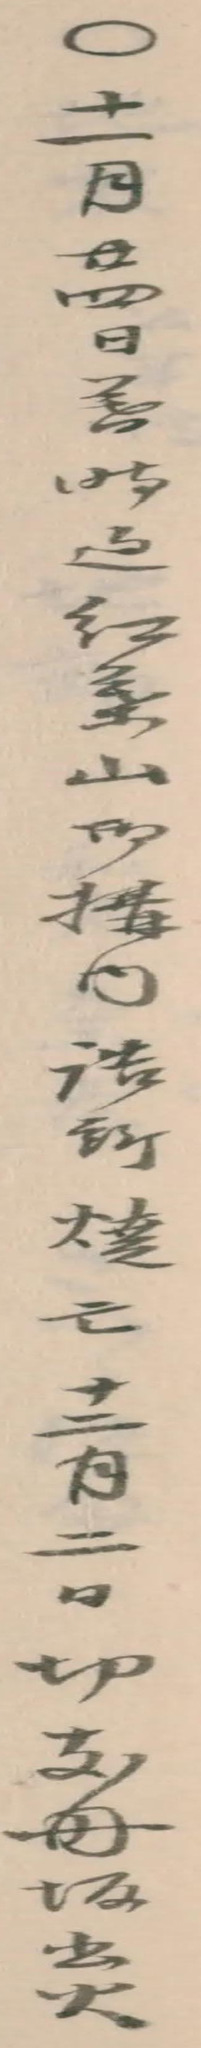〇十一月廿四日暮時過紅葉山御構内詰所焼亡十二月二日切支丹坂出火
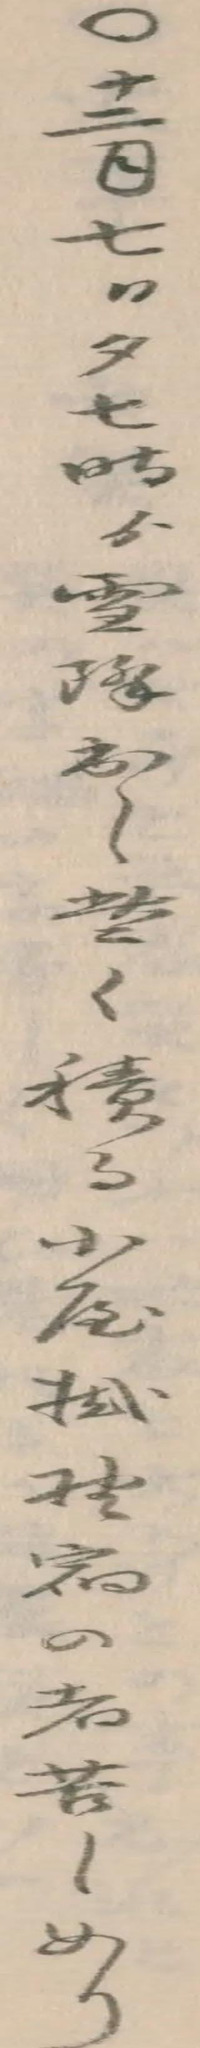〇十二月七日夕七時ゟ雪降出し些く積る小屋掛野宿の者苦しめり
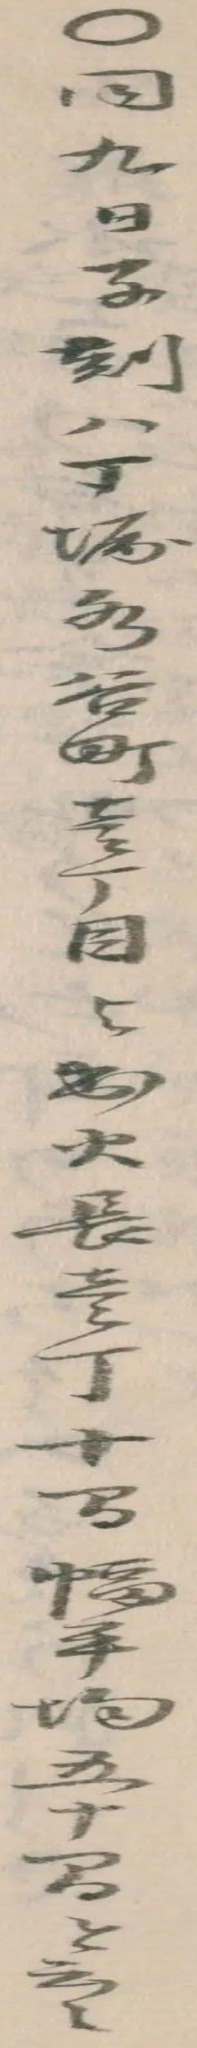〇同九日子刻八丁堀水谷町壱丁目よ出火長壱丁十間幅平均五十間と云々
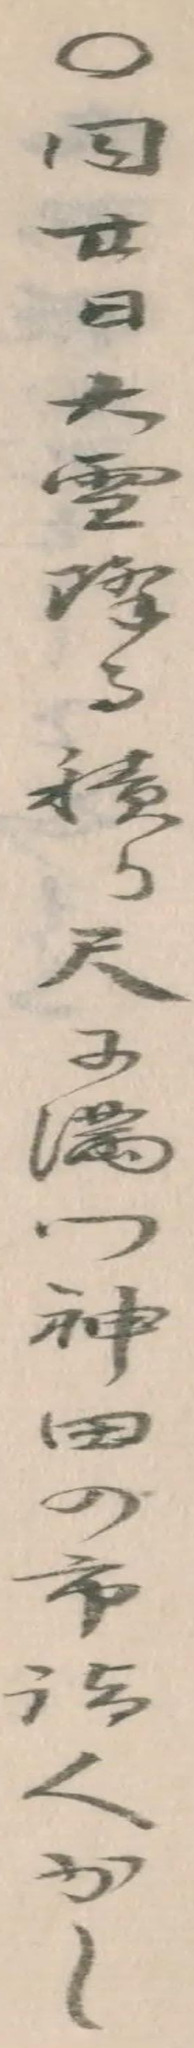〇同廿日大雪降る積り尺に滿つ神田の市詣人少し
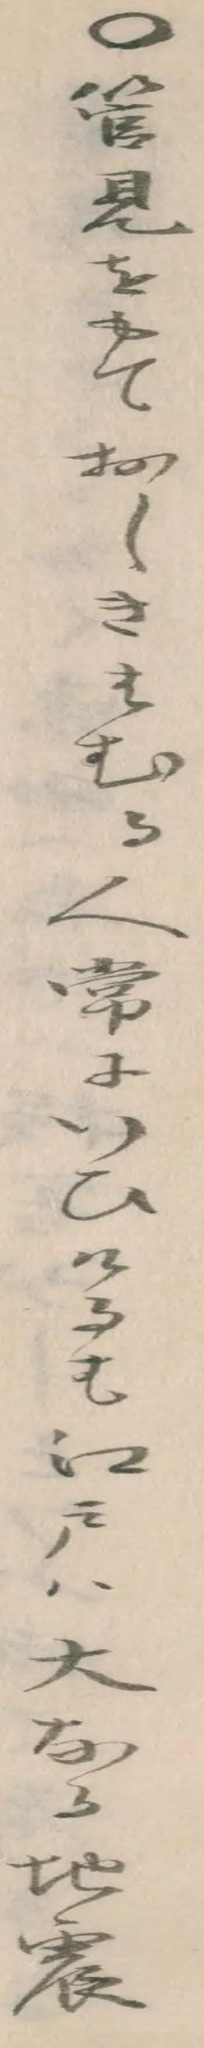〇管見をもておしきはむる人常にいひけるは江戸は大なる地震
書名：地災撮要. 巻7-9(地震之部)
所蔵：国立国会図書館 National Diet Library, JAPAN
